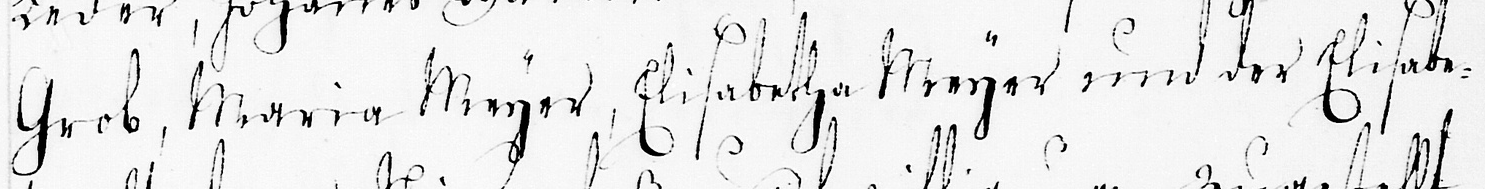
Grob, Maria Meyer, Elisabetha Meyer und der Elisabe¬
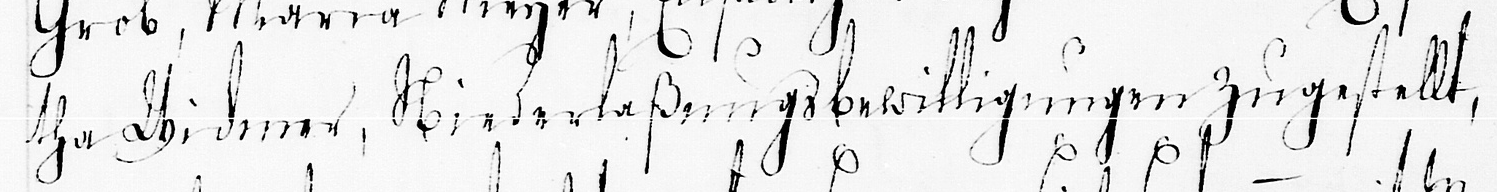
tha Widmer, Niederlaßungsbewilligungen zugestellt,
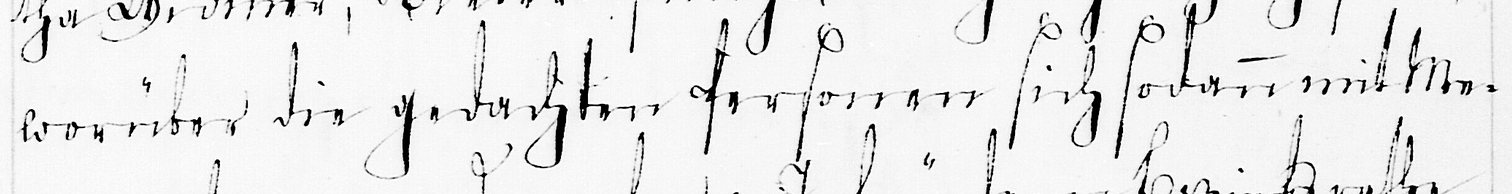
worüber die gedachten Personen sich sodann mit Me¬
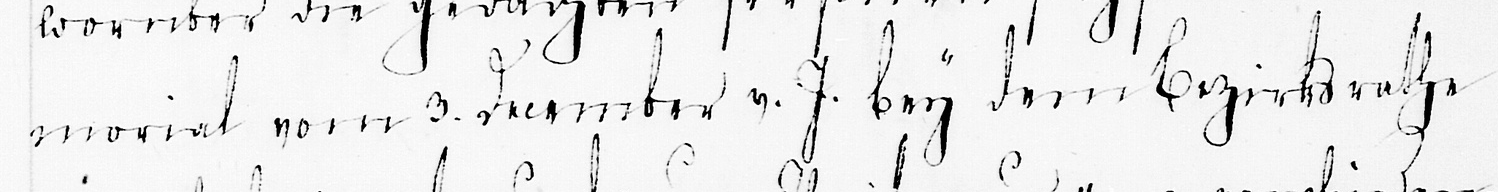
morial vom 3. December v. J. bey dem Bezirksrathe
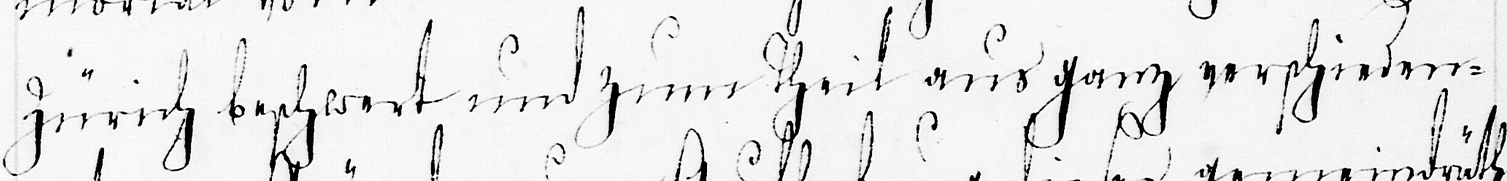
Zürich beschwert und zum Theil aus ganz verschieden¬
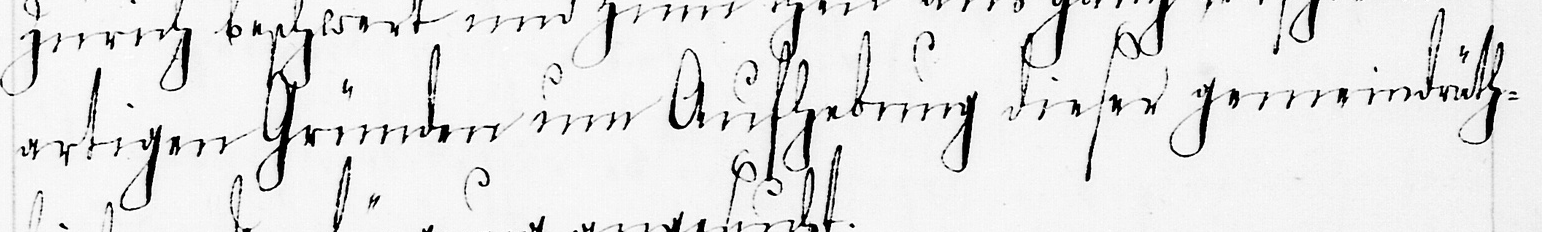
artigen Gründen um Aufhebung dieser gemeindräth¬
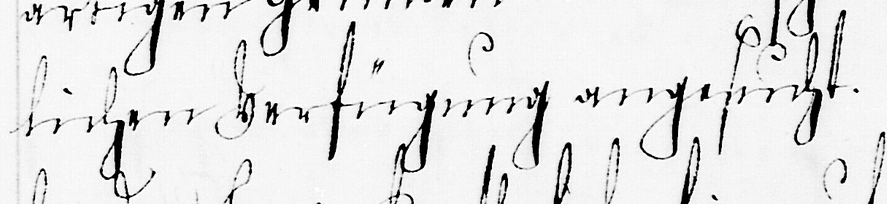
lichen Verfügung angesucht.
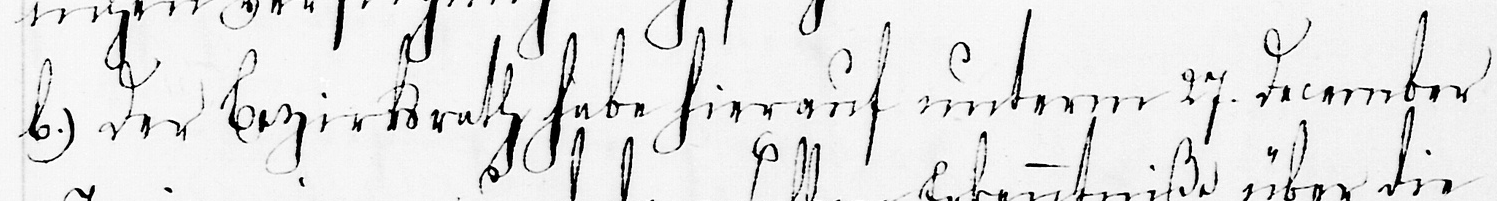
b.) Der Bezirksrath habe hierauf unterm 27. December
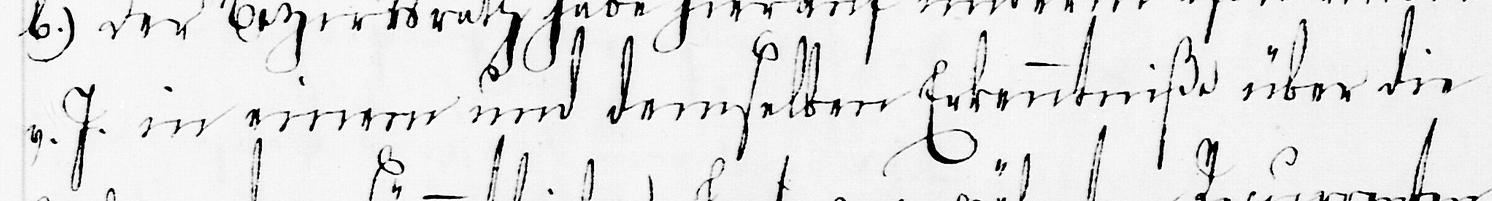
v. J. in einem und demselben Erkenntniße über die
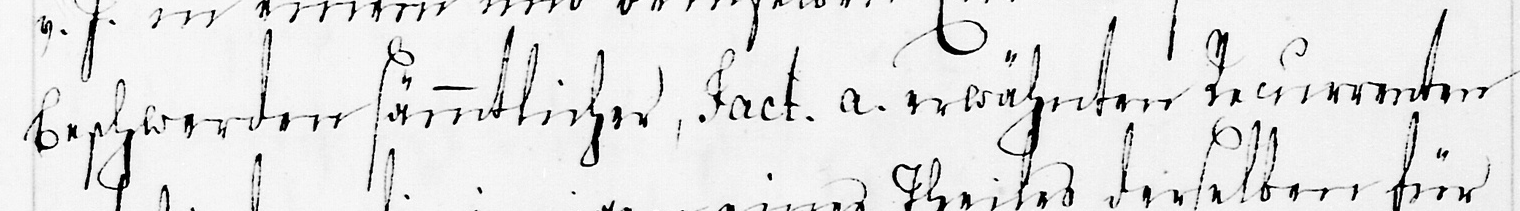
Beschwerden sämmtlicher, Fact. a. erwähnten Recurrenten
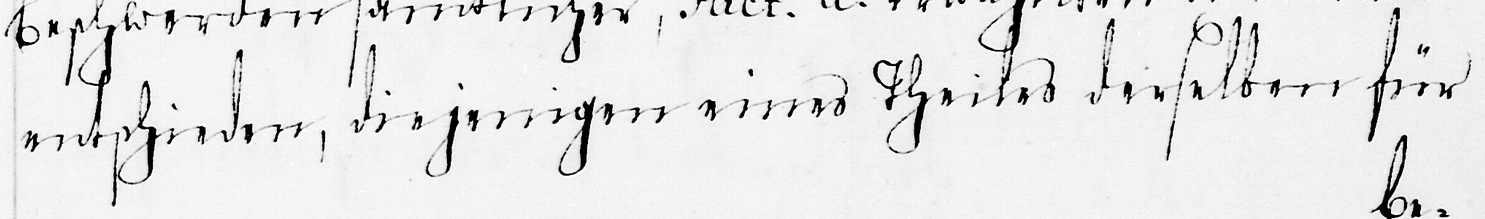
entschieden, diejenigen eines Theiles derselben für
